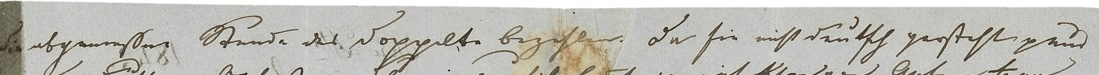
abgemessne Stunde das doppelte bezahlen. Da sie nicht deutsch versteht &
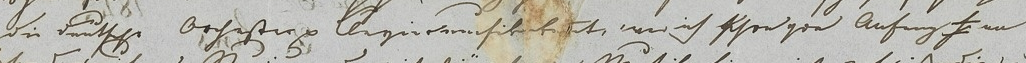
die deutsche Orchester & Claviermusik kennt, war ich schon von Anfang h an
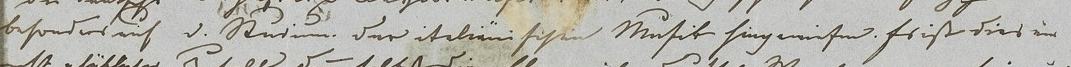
besonders auf d. Studium der italiänischen Musik hingewiesen. Es ist dies ein
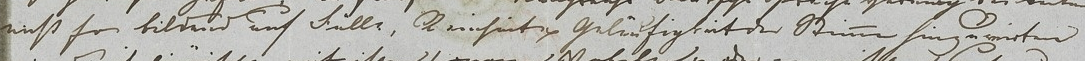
nicht so bildend auf Fülle, Reinheit & Geläufigkeit der Stimme hinzuwirken
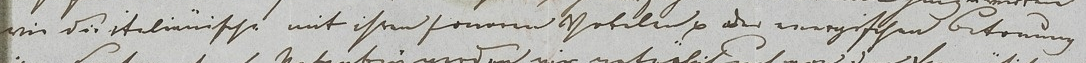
wie die italiänische mit ihren sonoren Vokalen & der energischen Betonung
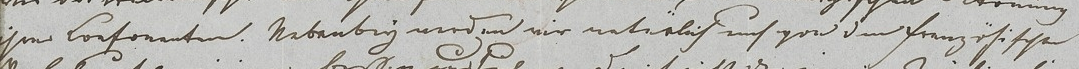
ihrer Consonanten. Nebenbey werden wir natürlich auch von der französischen
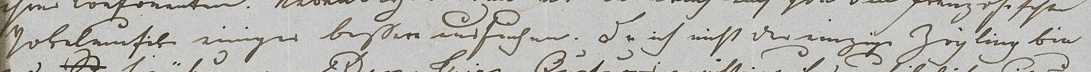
Vokalmusik einiges bessere aussuchen. Da ich nicht der einzige Zögling bin
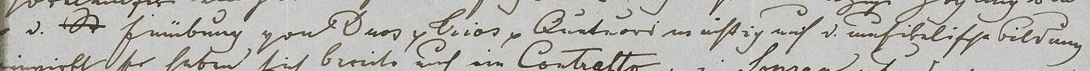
& d. St Einübung von Duos & Trios & Quatuors mächtig auf d. musikalische Bildung
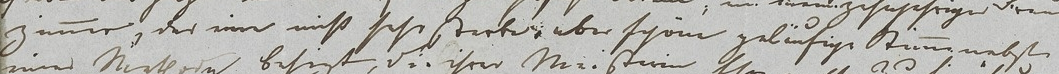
zimmer, das eine nicht sehr starke, aber schöne geläufige Stimme nebst
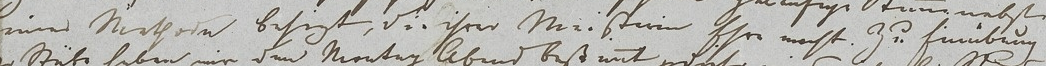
einer Methode besizt, die ihrer Meisterin Ehre macht. Zu Einübung
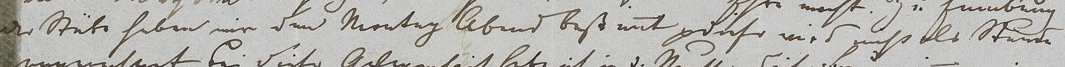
der Stüke haben wir den Montag Abend bestimmt & dieser wird nicht als Stunde
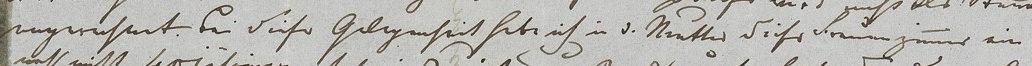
angerechnet. Bei dieser Gelegenheit habe ich in d. Mutter dieses Frauenzimmers ein
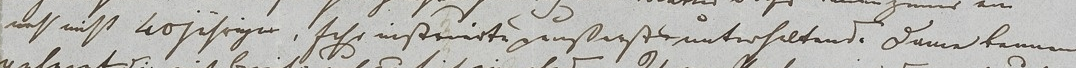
noch nicht 40jähriges, sehr instruirte & äußerst unterhaltende Dame kennen
